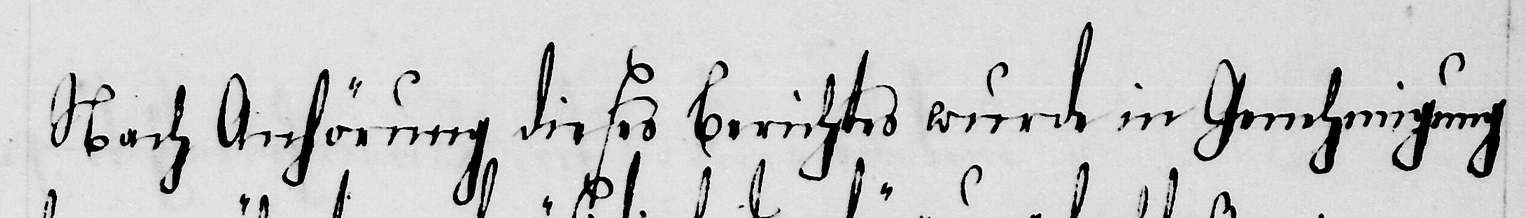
Nach Anhörung dieses Berichtes wurde in Genehmigung
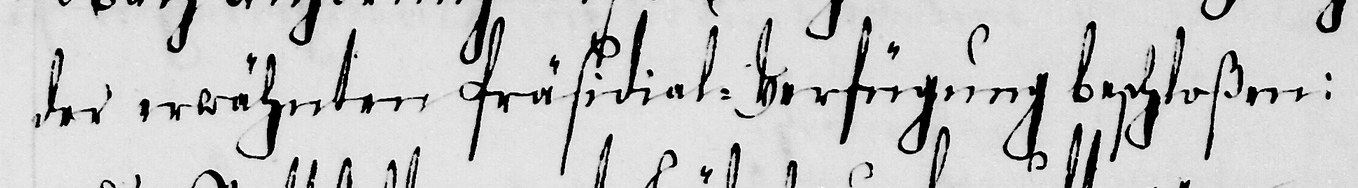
der erwähnten Präsidial-Verfügung beschloßen:
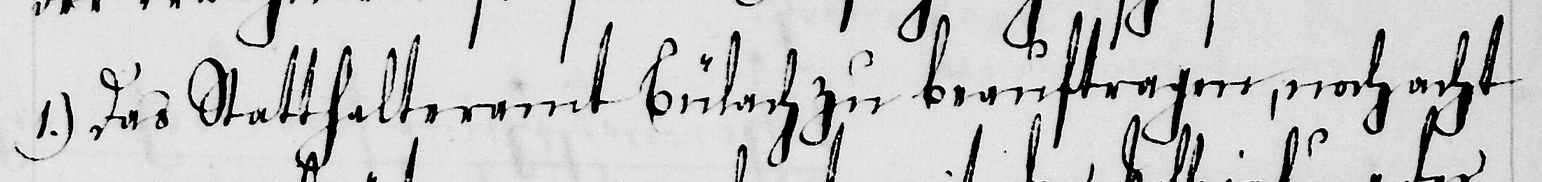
1.) Das Statthalteramt Bülach zu beauftragen, noch acht
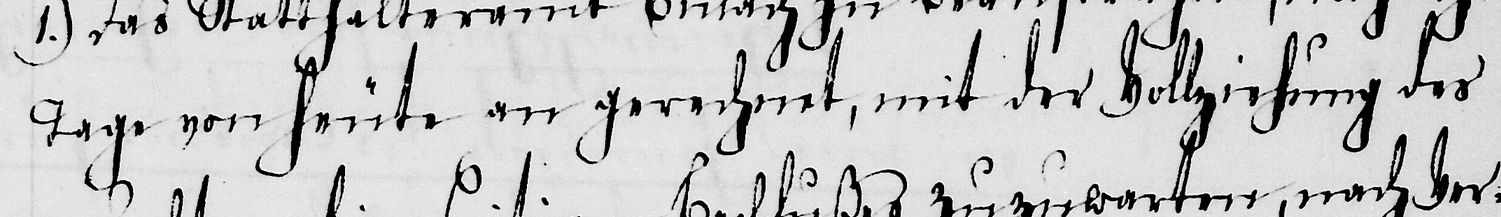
Tage von heute an gerechnet, mit der Vollziehung des
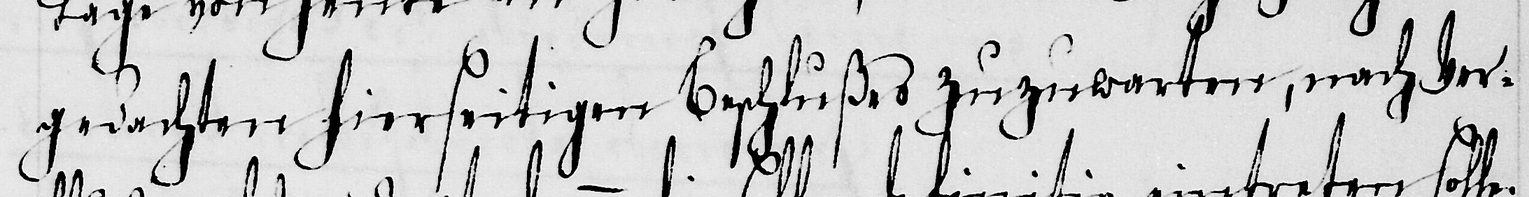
gedachten hierseitigen Beschlußes zuzuwarten, nach Ver¬
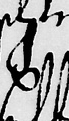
e.
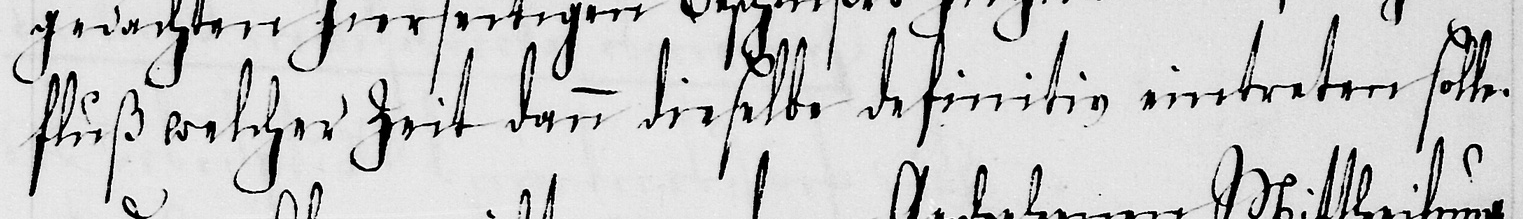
fluß welcher Zeit dann dieselbe definitiv eintreten soll¬
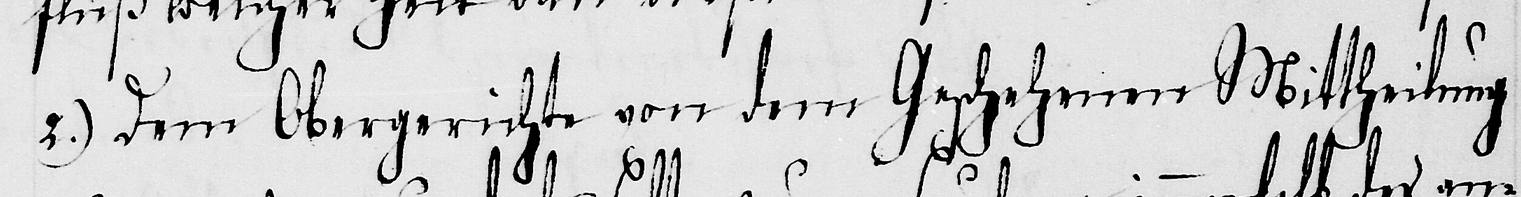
2.) Dem Obergerichte von dem Geschehenen Mittheilung
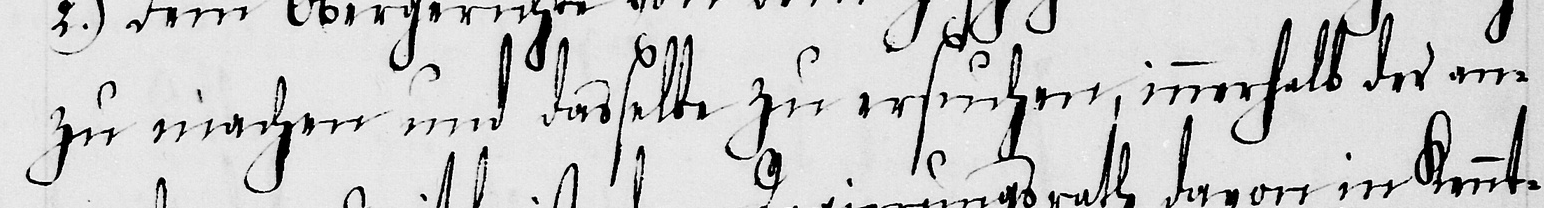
zu machen und dasselbe zu ersuchen, innerhalb der an¬
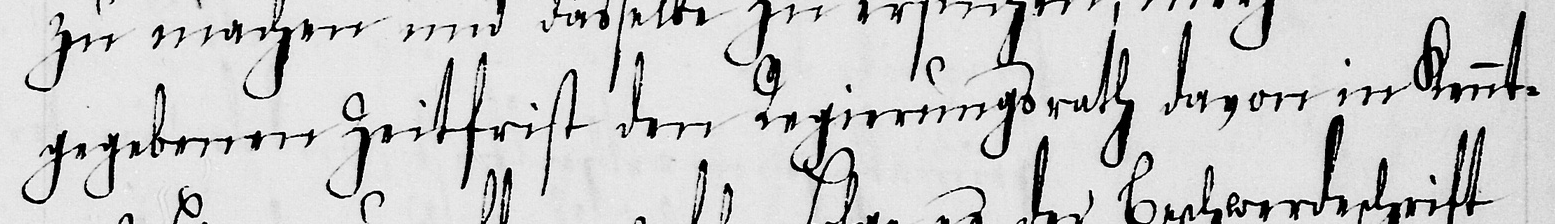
gegebenen Zeitfrist den Regierungsrath davon in Kennt¬
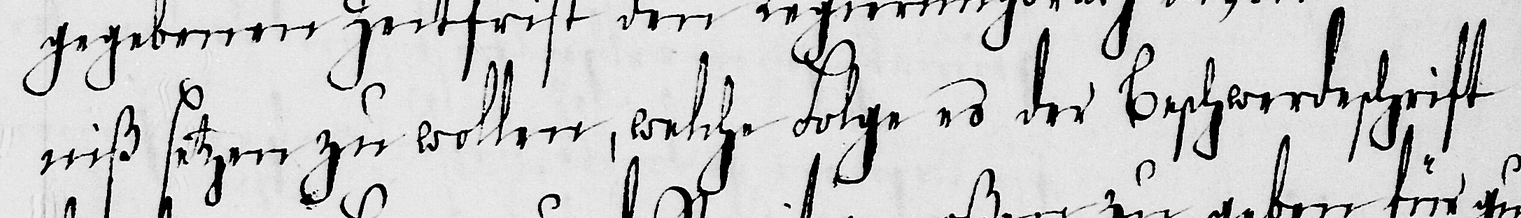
niß setzen zu wollen, welche Folge es der Beschwerdeschrift
